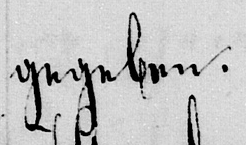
gegeben.
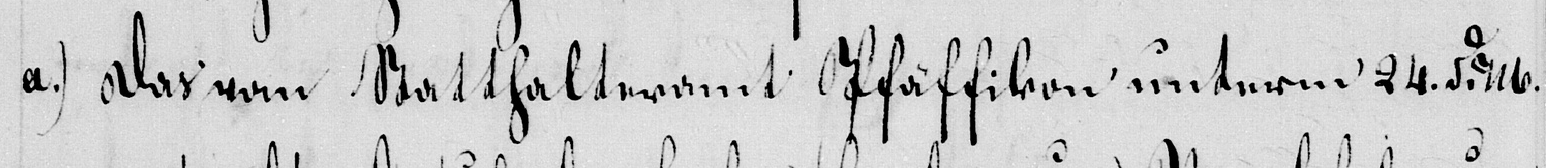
a.) Das vom Statthalteramt Pfäffikon unterm 24. d. M.
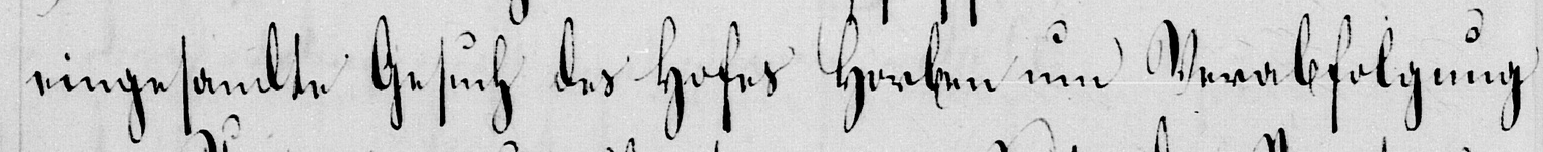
eingesandte Gesuch des Hofes Horben um Verabfolgung
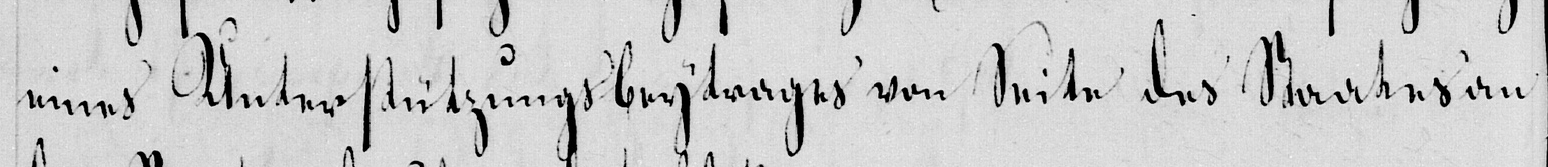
eines Unterstützungsbeytrages von Seite des Staates an
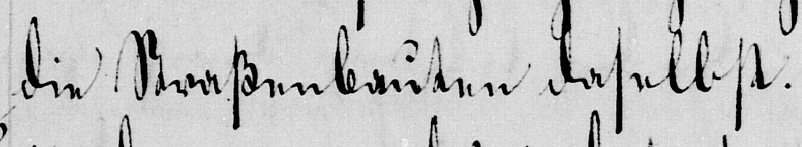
die Straßenbauten daselbst.
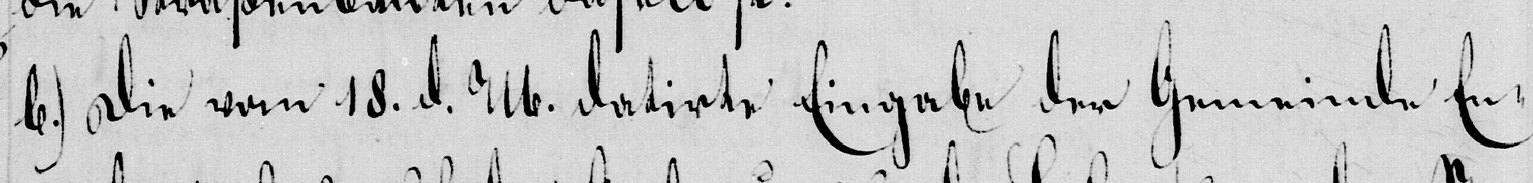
b.) Die vom 18. d. M. datirte Eingabe der Gemeinde En¬
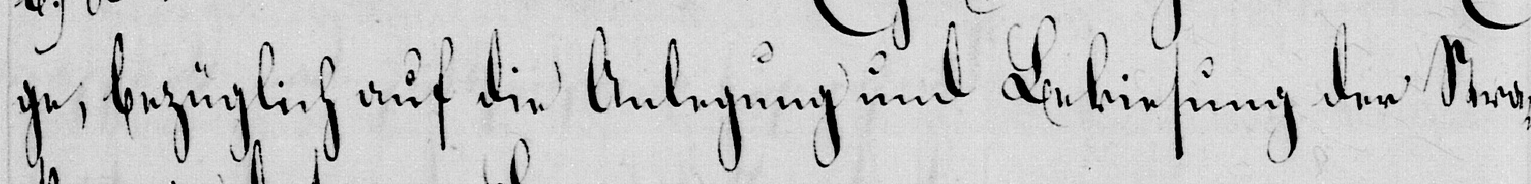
ge, bezüglich auf die Anlegung und Bekiesung der Stra¬
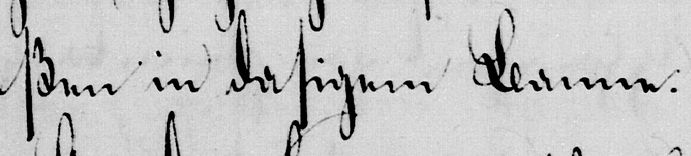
ßen im dasigen Banne.
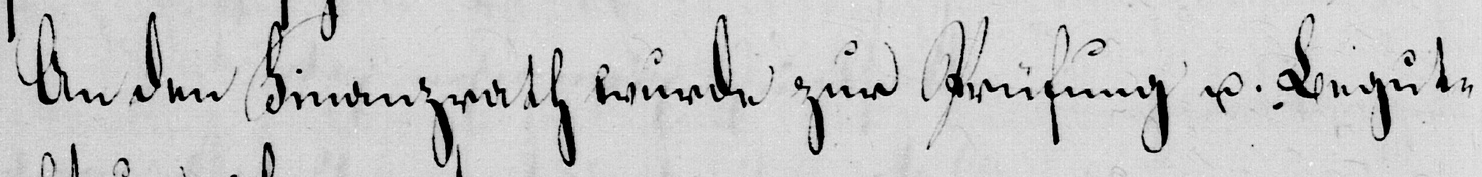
An den Finanzrath wurde zur Prüfung u. Begut¬
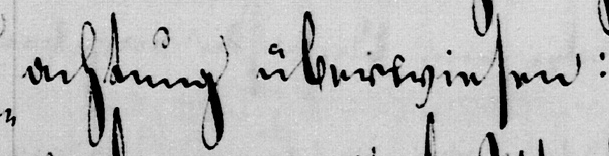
achtung überwiesen:
